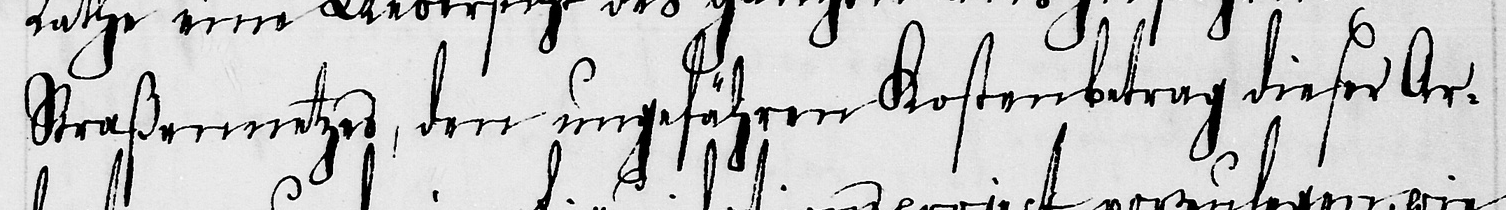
Straßennetzes, den ungefähren Kostenbetrag dieser Ar¬
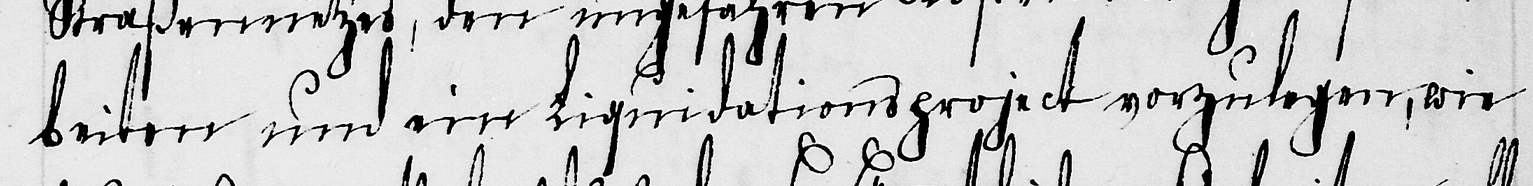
beiten und ein Liquidationsproject vorzulegen, wie
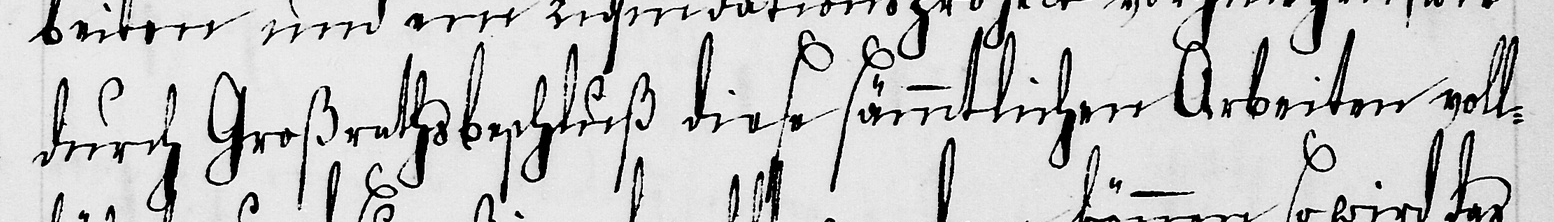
durch Großrathsbeschluß diese sämmtlichen Arbeiten voll¬
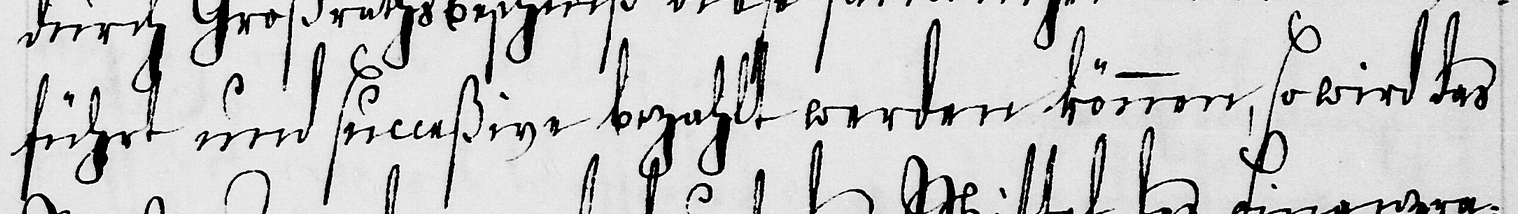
führt und succeßive bezahlt werden können, so wird das
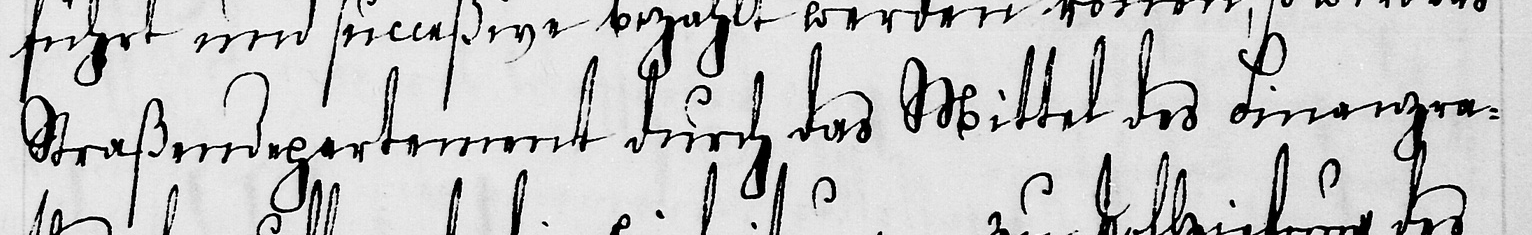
Straßendepartement durch das Mittel des Finanzra¬
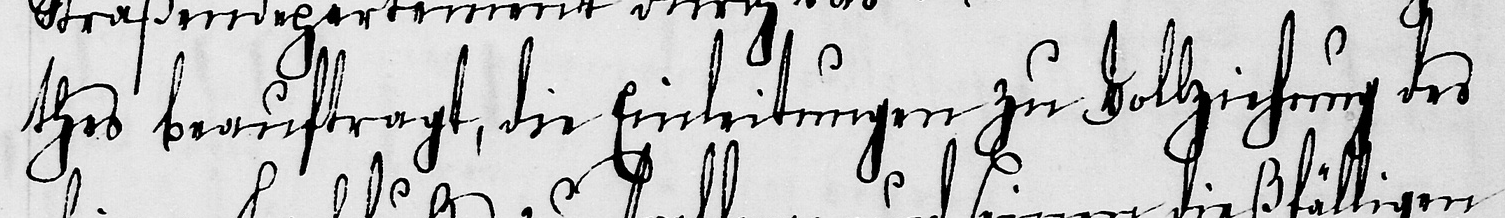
thes beauftragt, die Einleitungen zu Vollziehung des
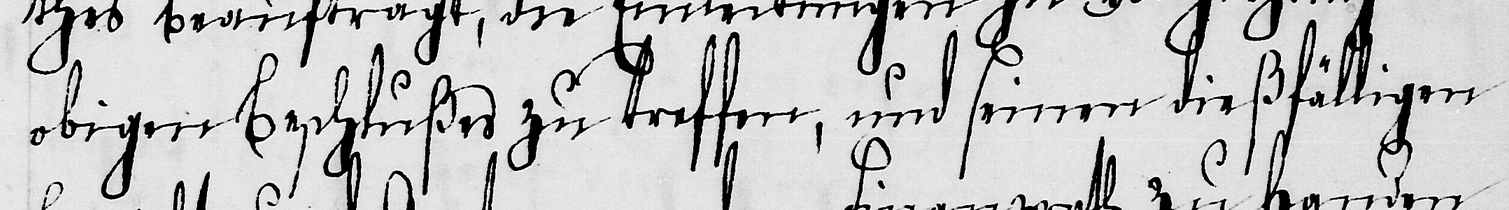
obigen Beschlußes zu treffen, und seinen dießfälligen
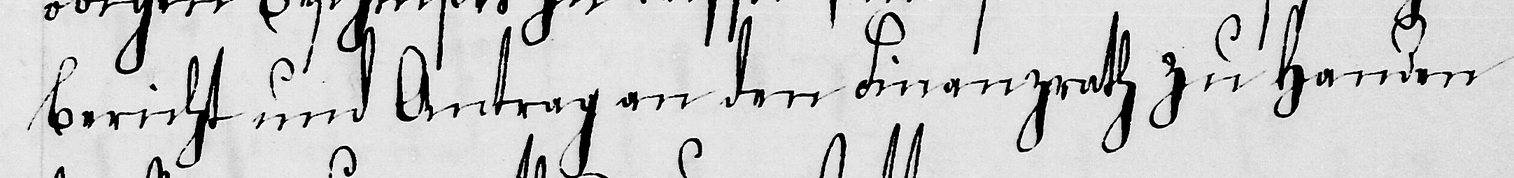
Bericht und Antrag an den Finanzrath zu Handen
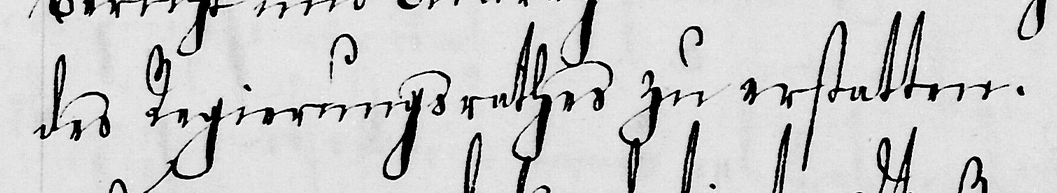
des Regierungsrathes zu erstatten.
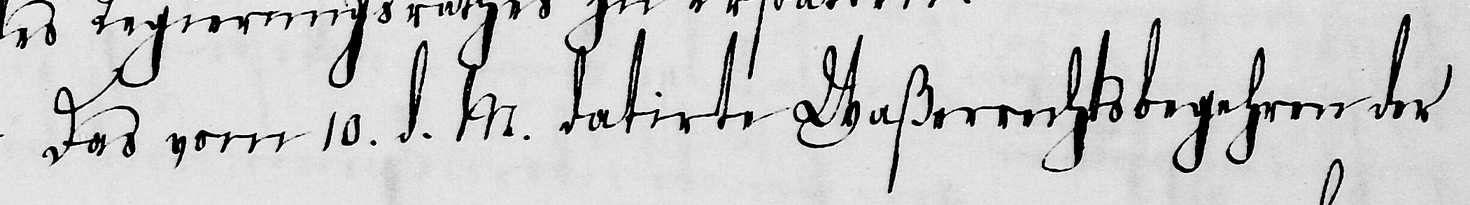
Das vom 10. d. M. datirte Waßerrechtsbegehren der
